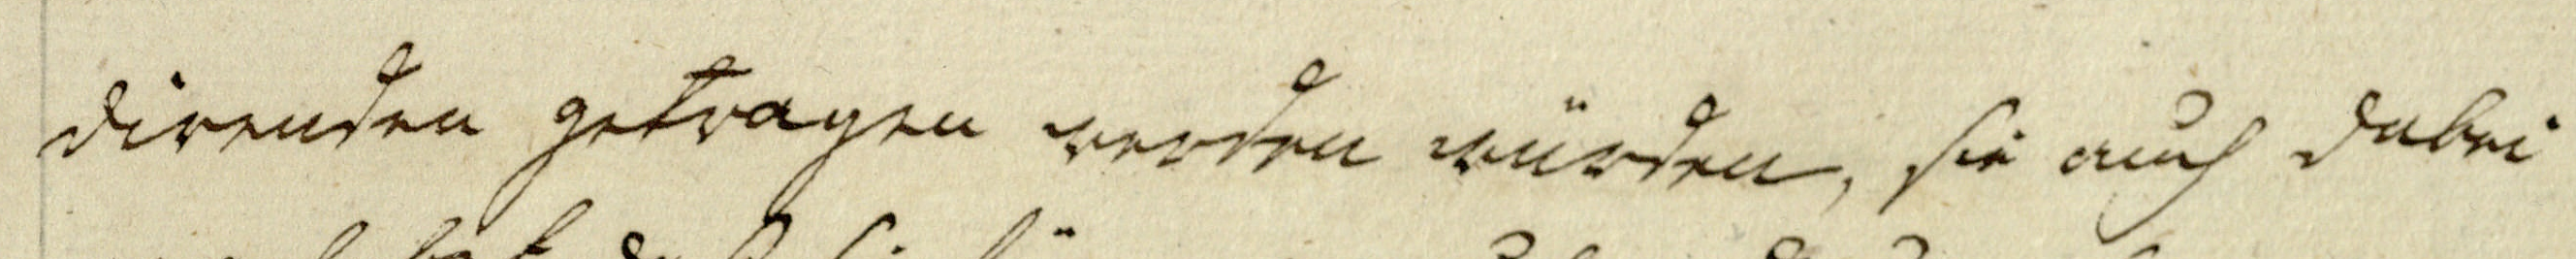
direnden getragen werden würden, sie auch dabei
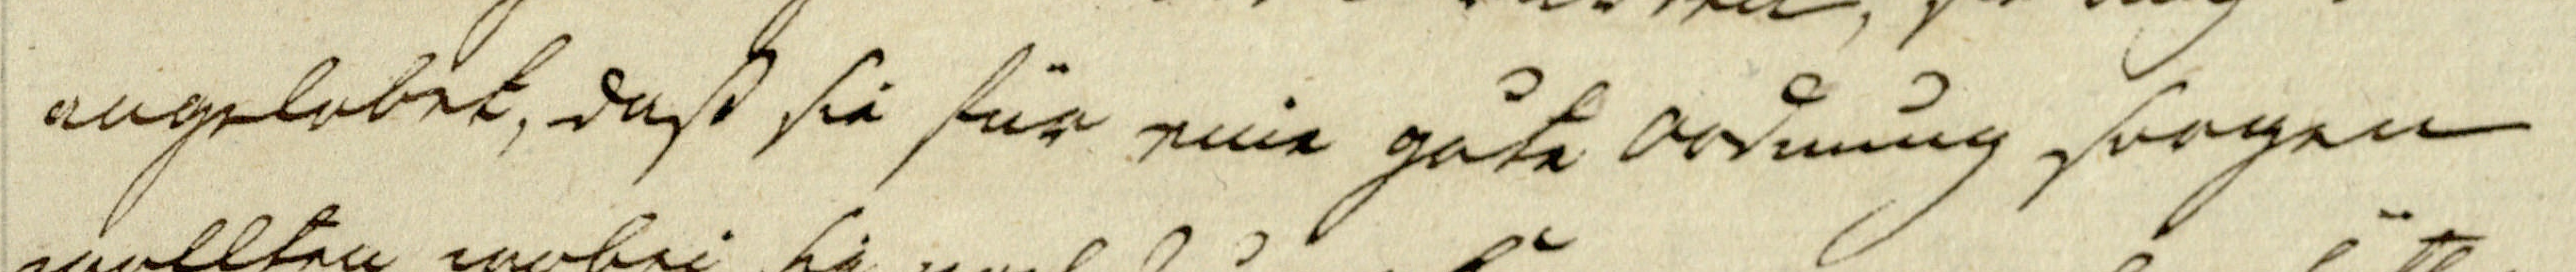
angelobet, daß sie für eine gute Ordnung sorgen
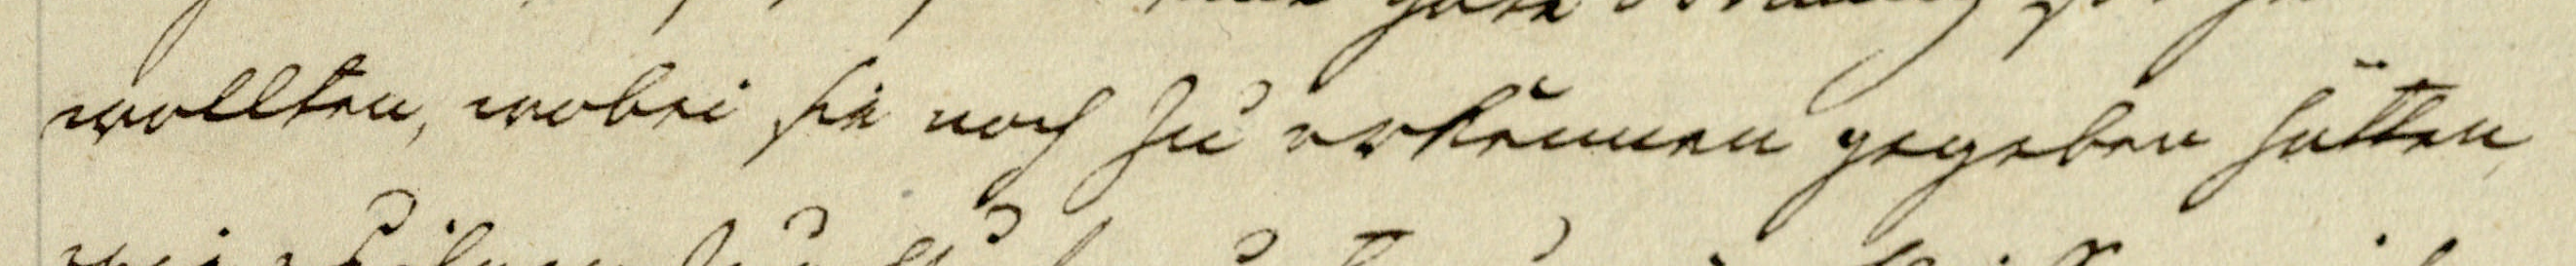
wollten, wobei sie noch zu erkennen gegeben hätten
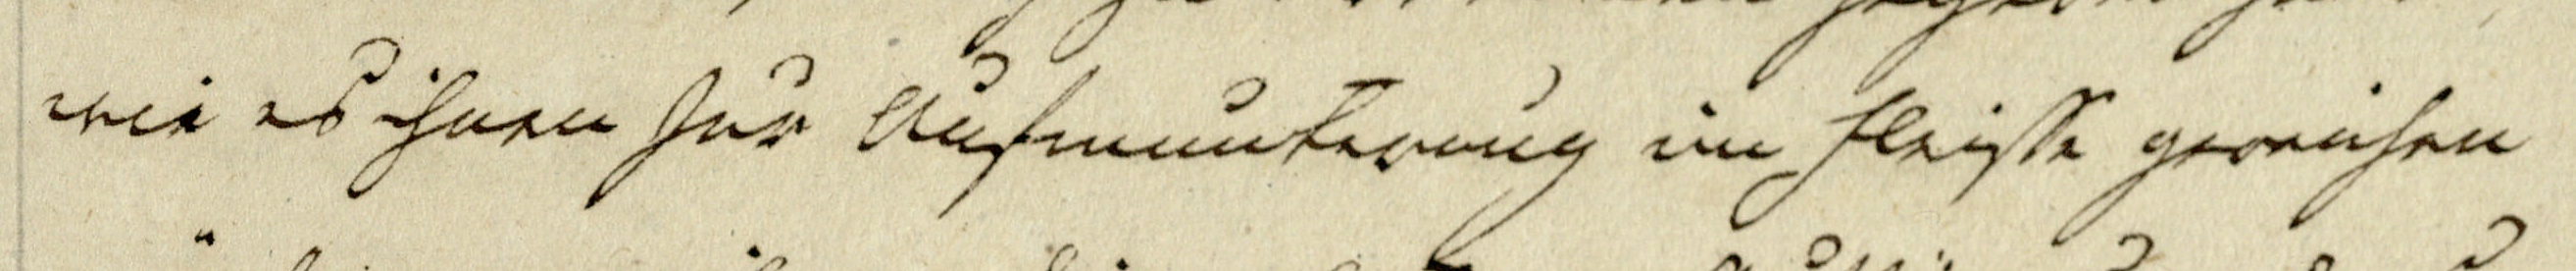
wie es ihnen zur Aufmunterung im Fleisse gereichen
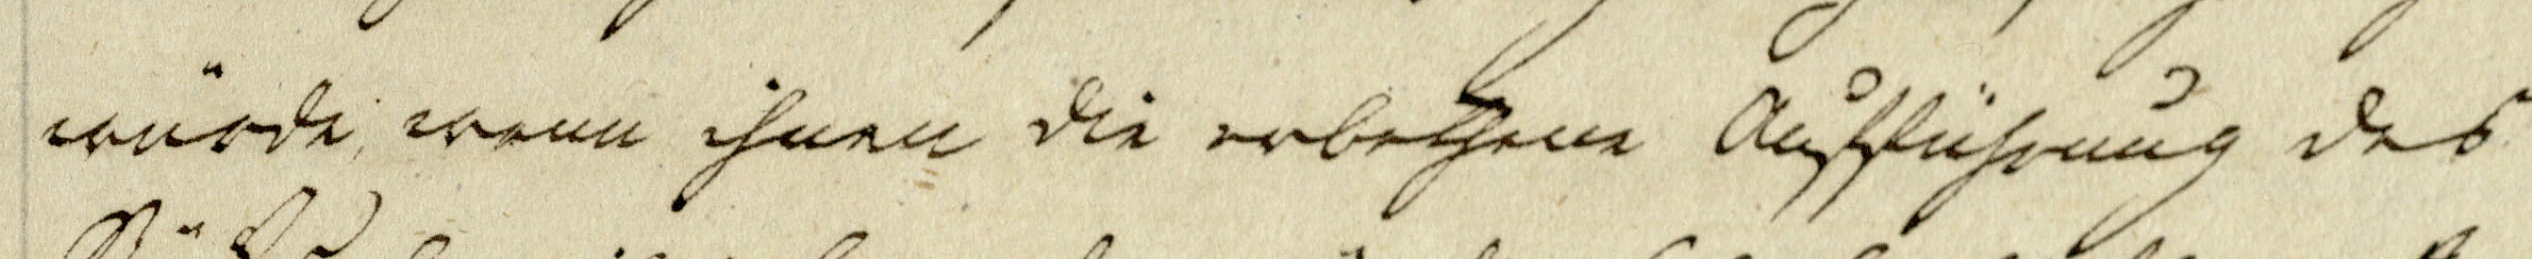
würde, wenn ihnen die erbethene Aufführung des
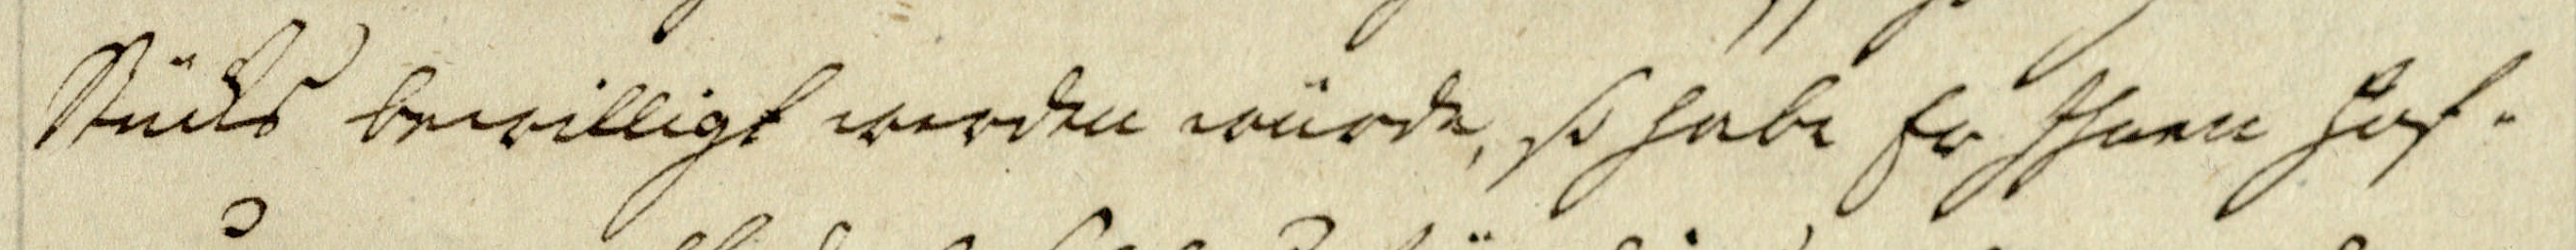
Stücks bewilligt werden würde, so habe Er ihnen Hof¬
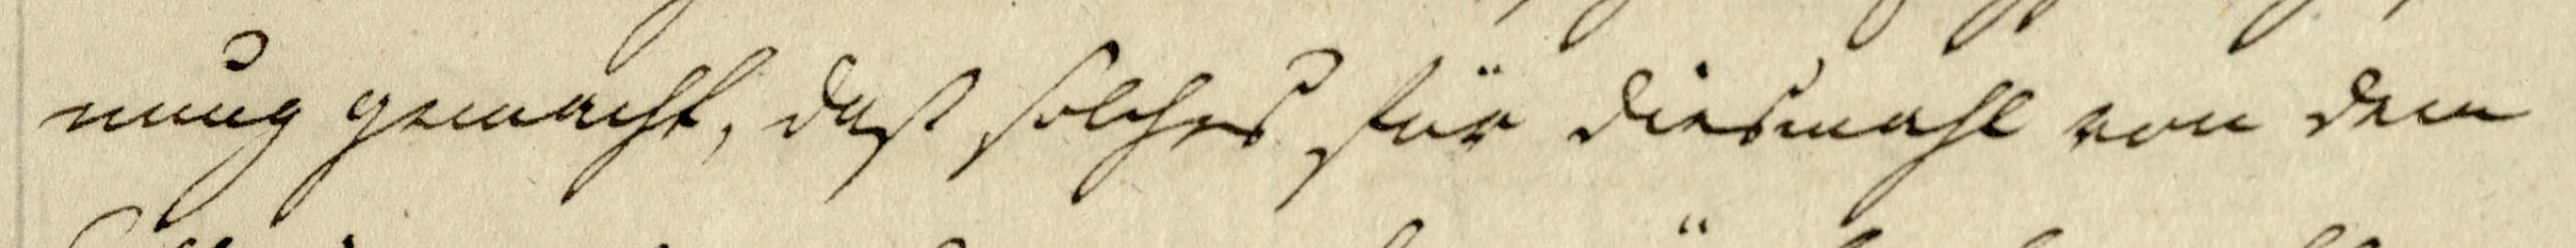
nung gemacht, daß solches für diesmahl von dem
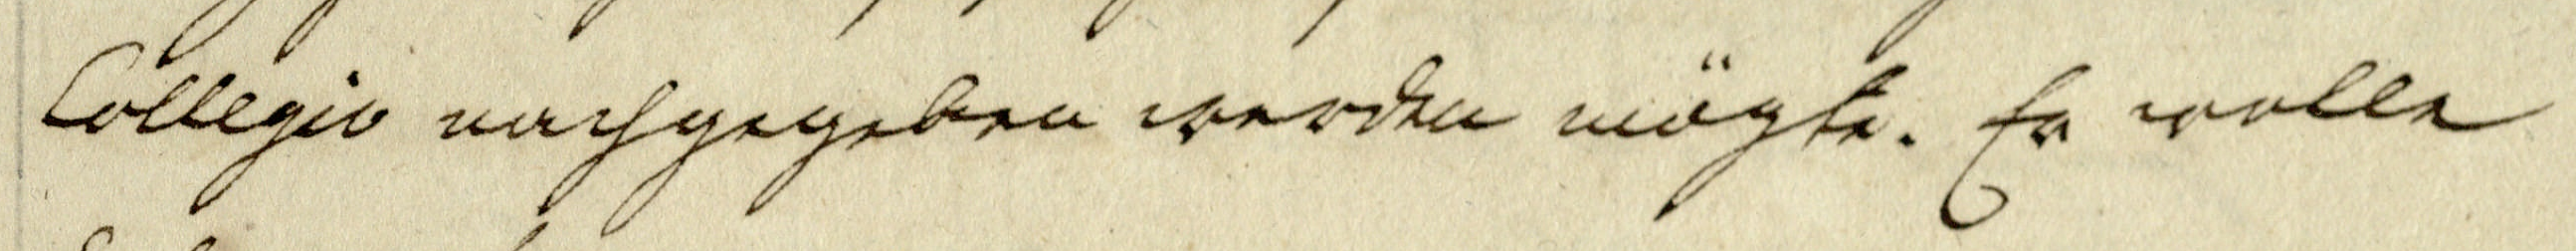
Collegio nachgegeben werden mögte. Er wolle
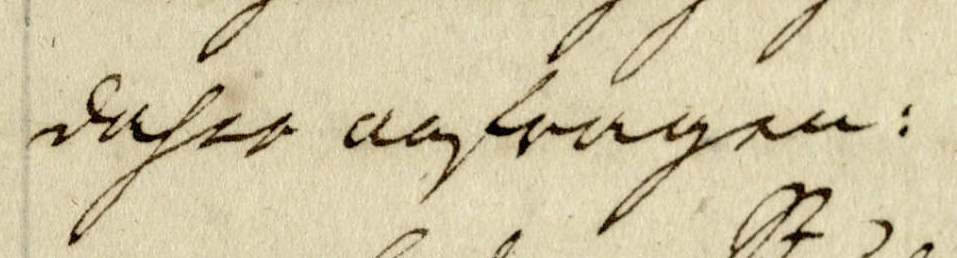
daher anfragen:
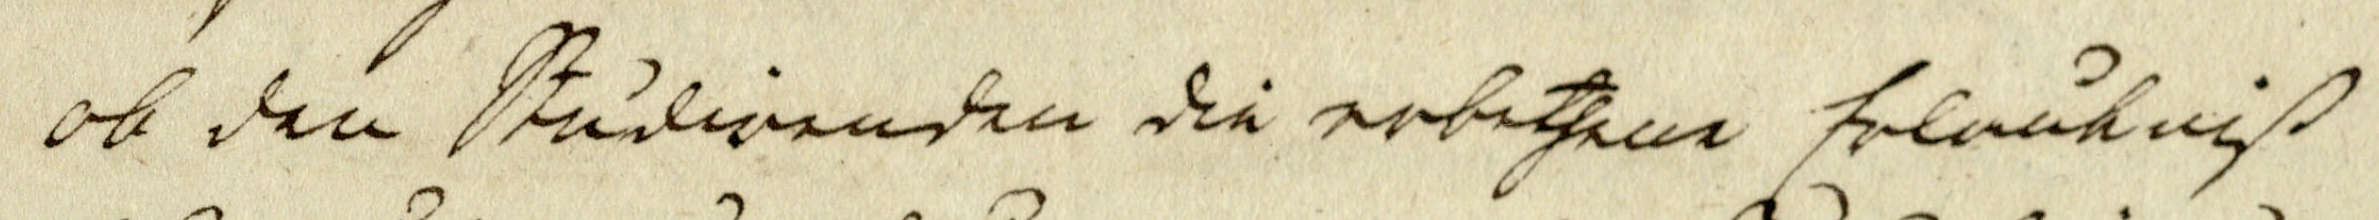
ob den Studirenden die erbethene Erlaubniß
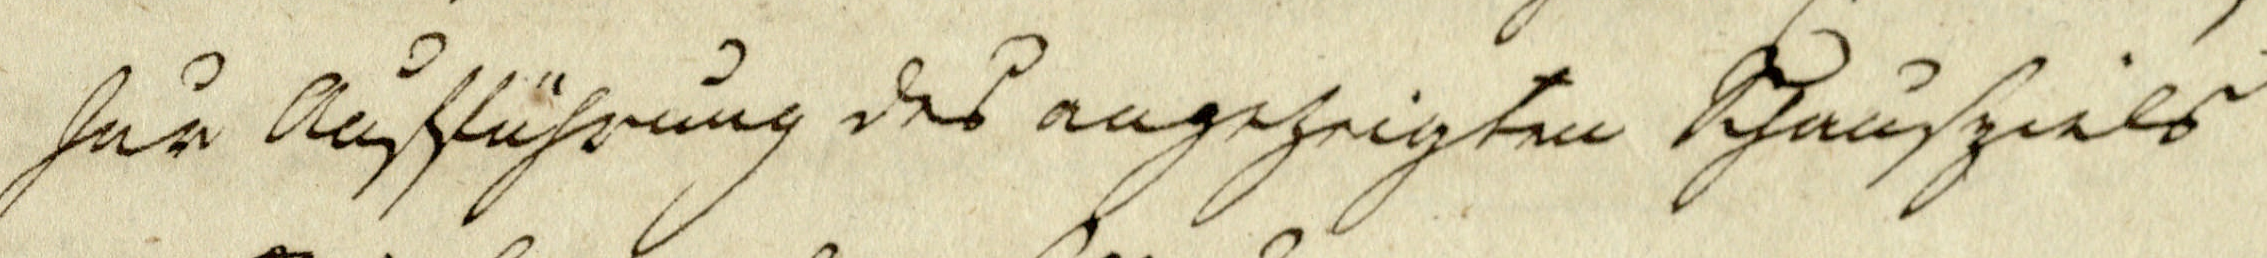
zur Anführung des angezeigten Schauspiels
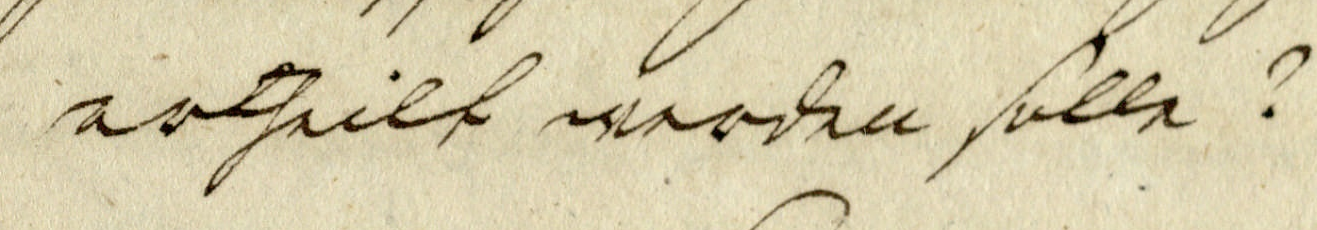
ertheilt werden solle?
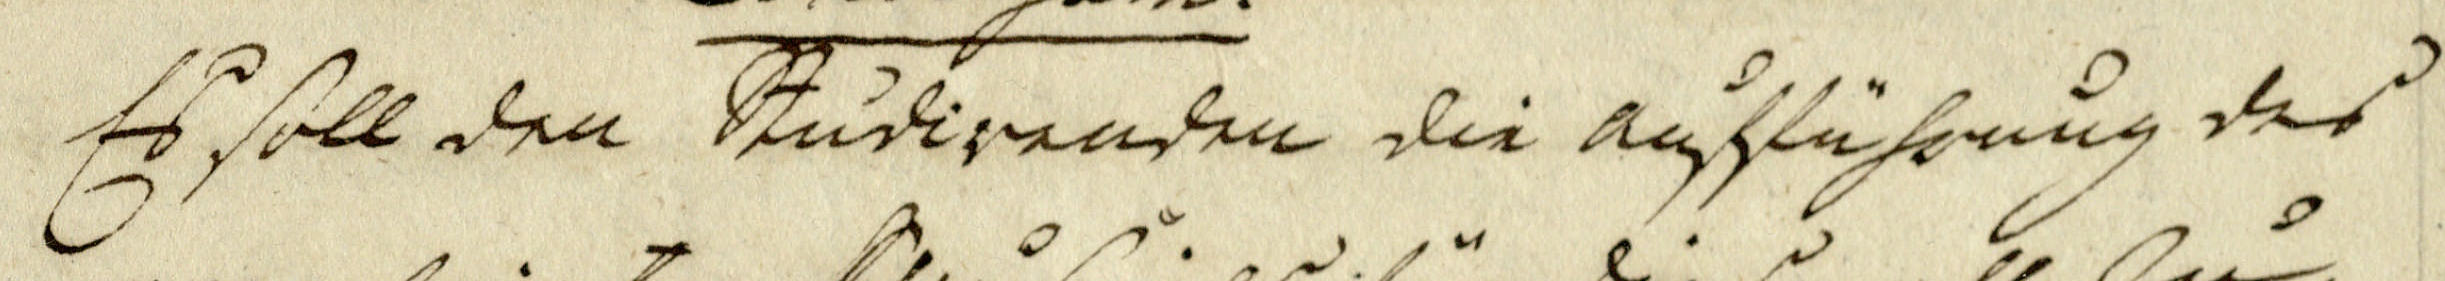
Es soll den Studirenden die Aufführung des
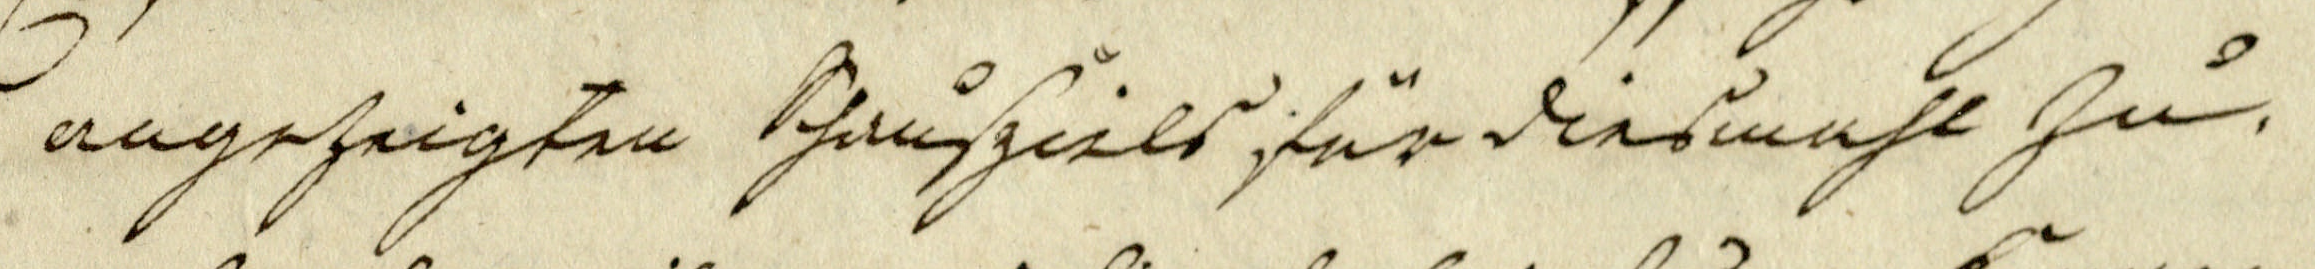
angezeigten Schauspiels für diesmahl zu¬
